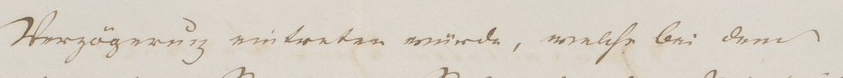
Verzögerung eintreten würde, welche bei dem
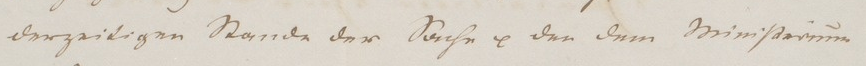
derzeitigen Stande der Sache & den dem Ministerium
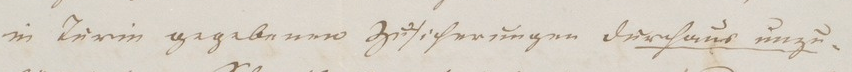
in Turin gegebenen Zusicherung durchaus unzu-
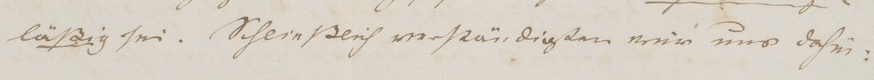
läßig sei. Schließlich verständigten wir uns dahin:
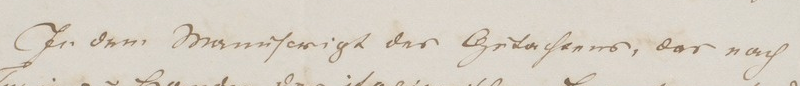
In dem Manuscript des Gutachtens, das nach
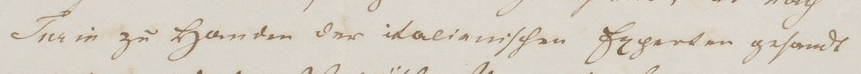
Turin zu Handen der italienischen Experten gesandt
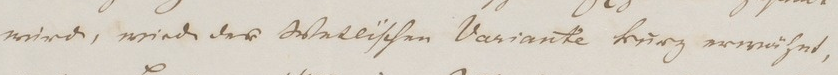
wird, wird der Wetlischen Variante kurz erwähnt,
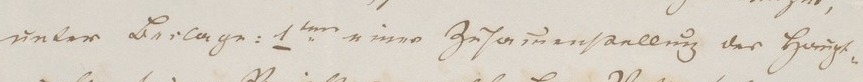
unter Beilage: 1tens einer Zusammenstellung der Haupt-
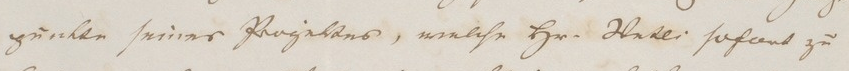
punkte seines Projektes, welche Hr. Wetli sofort zu
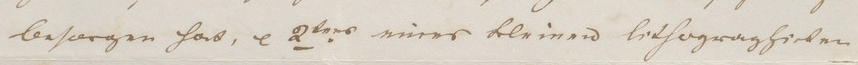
besorgen hat, & 2tenseines kleinen lithographirten
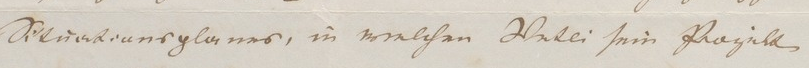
Situationsplanes, in welchen Wetli sein Projekt
